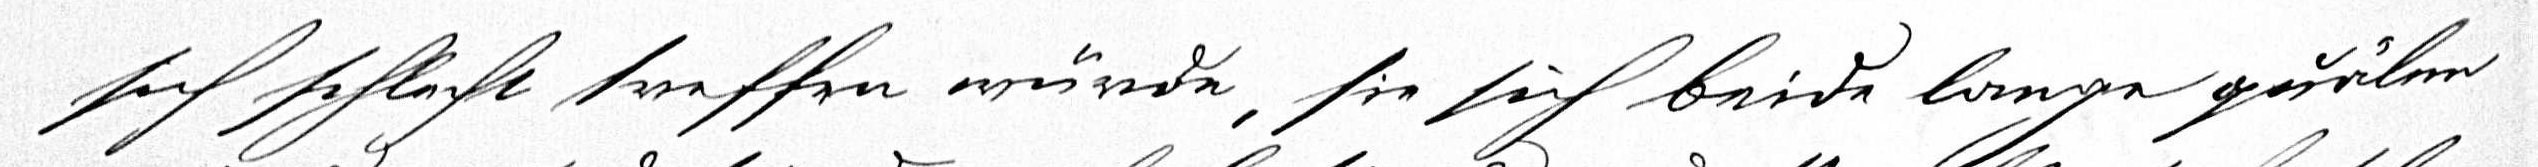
sich schlehct treffen würde, sie sich beide lange quälen
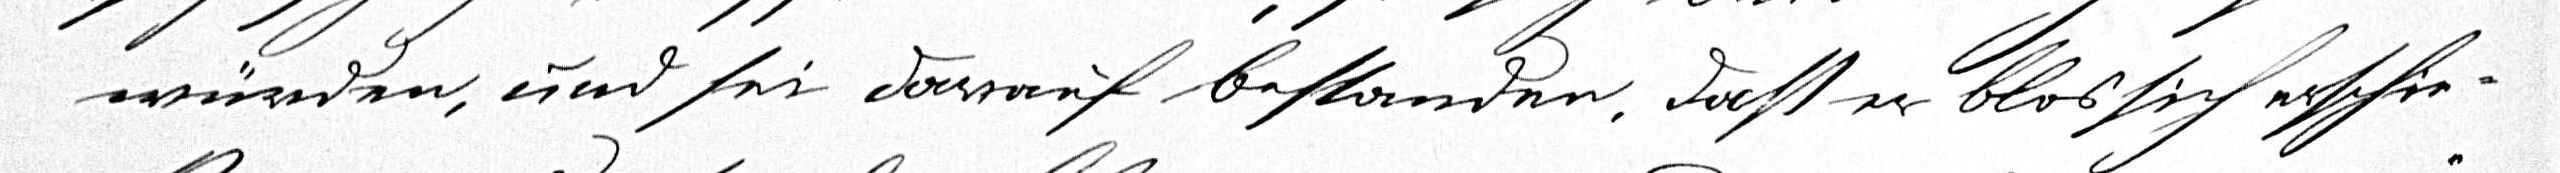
würden, und sei darauf bestanden, daß er blos sich erschie¬
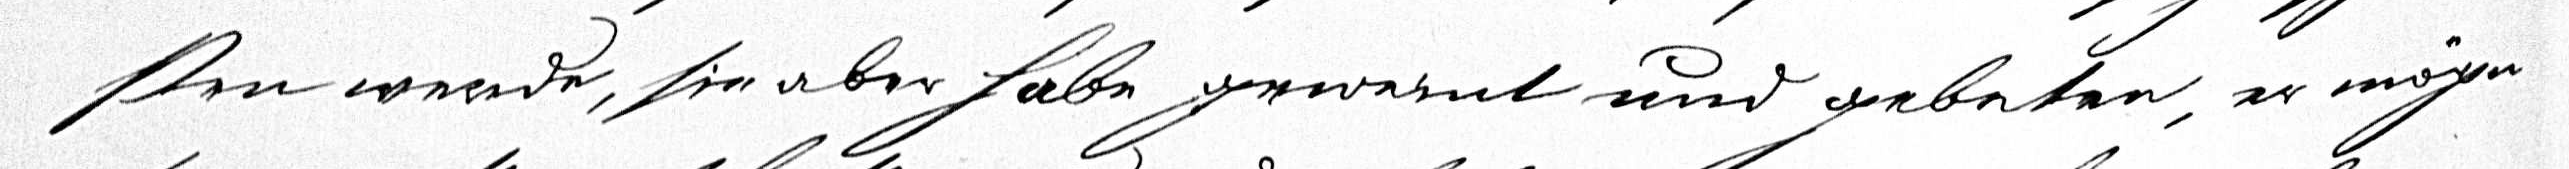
ßen werde, sie aber habe geweint und gebeten, er möge
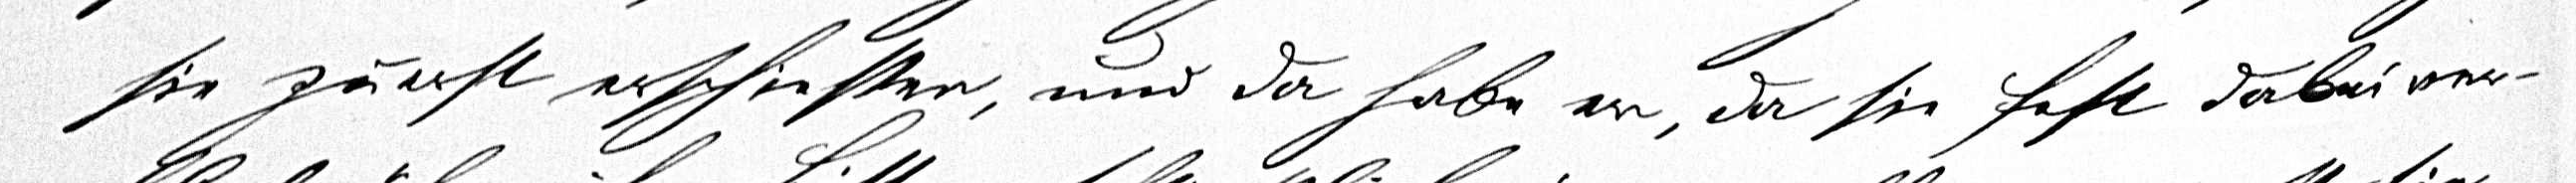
sie zuerst erschießen, und da habe er, da sie fest dabei ver¬
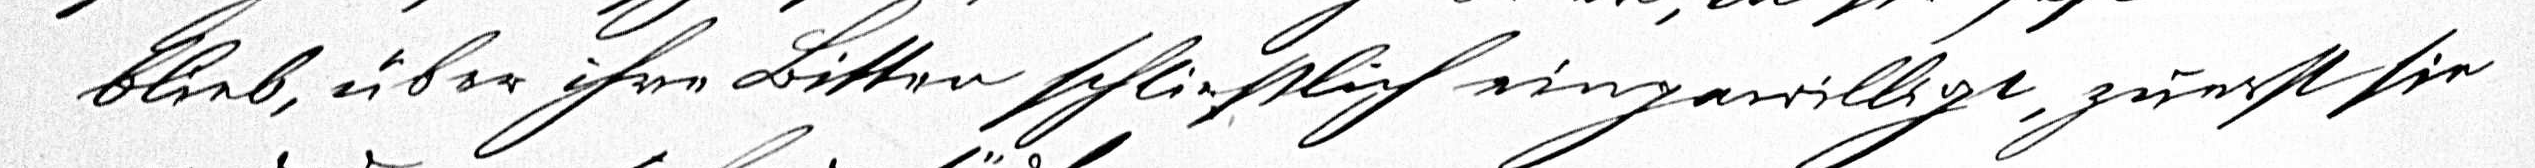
blieb, über ihre Bitte schließlich eingewilligt, zuerst sie
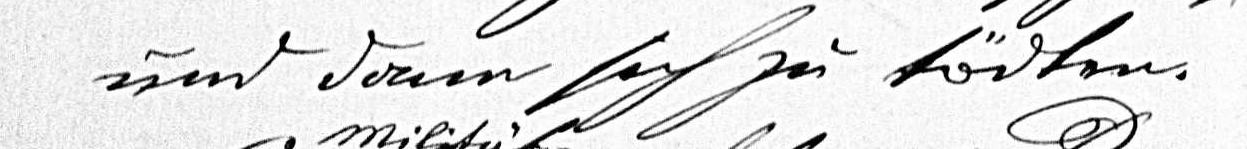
und dann sich zu tödten.
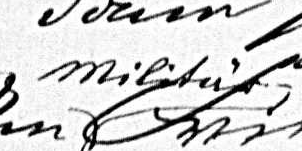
Militär
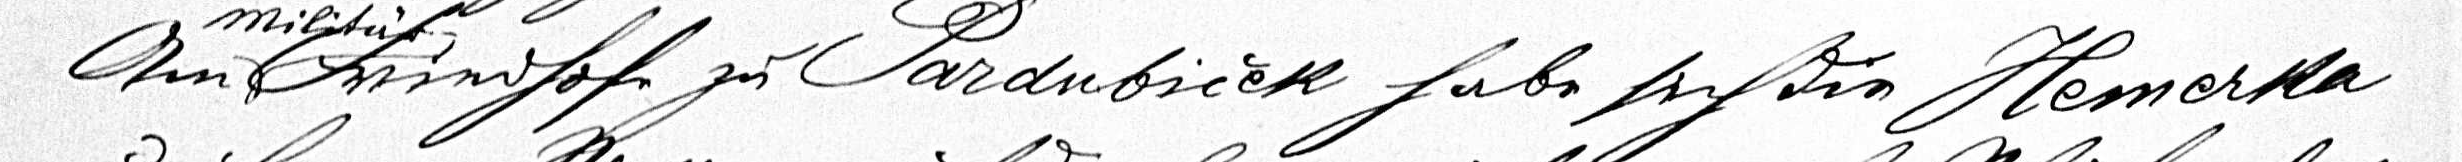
Am Friedhof zu Pardubicĕk habe sich die Hemerka
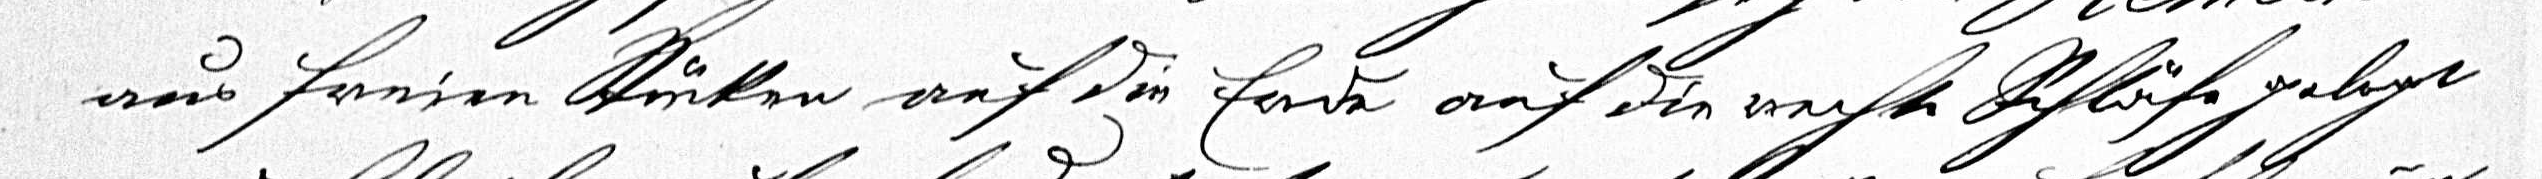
aus freien Stücke auf die Erde auf die rechte Schläfe gelegt
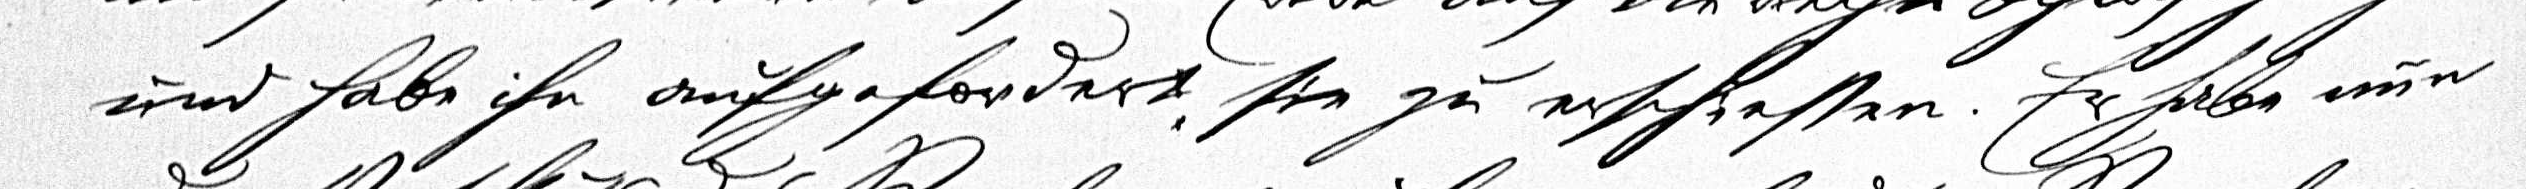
und habe ihn aufgefordert sie zu erschießen. Er habe nun
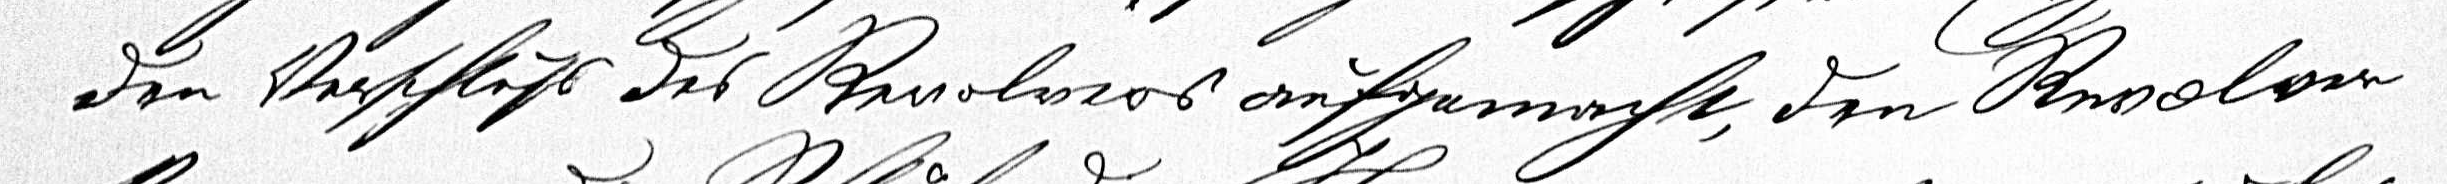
Verschluß des Revolvers aufgemacht, den Revolver
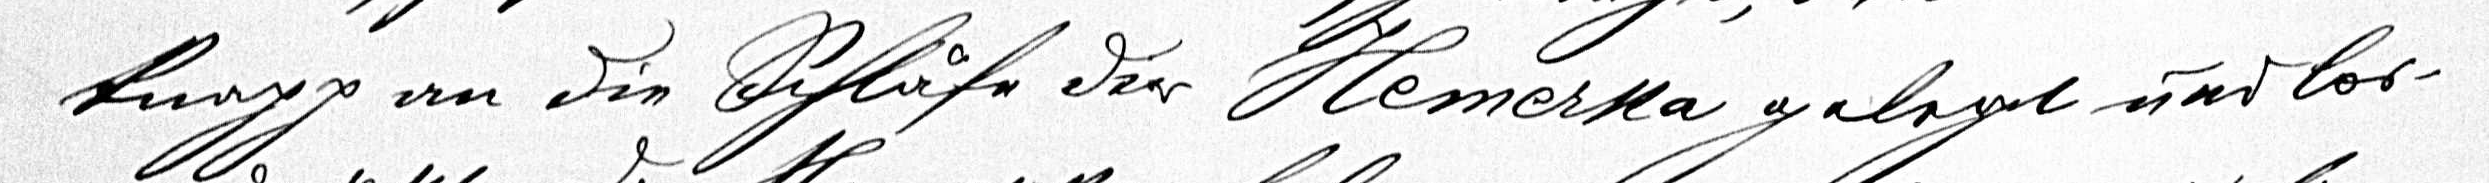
knapp an die Schläfe der Hemerka gelegt und los¬
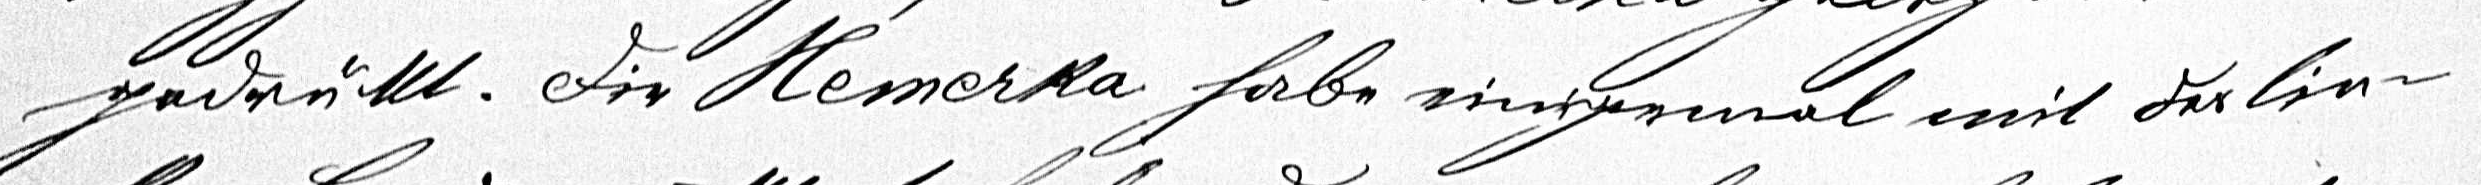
gedrückt. Die Hemerka habe einigemal mit der lin¬
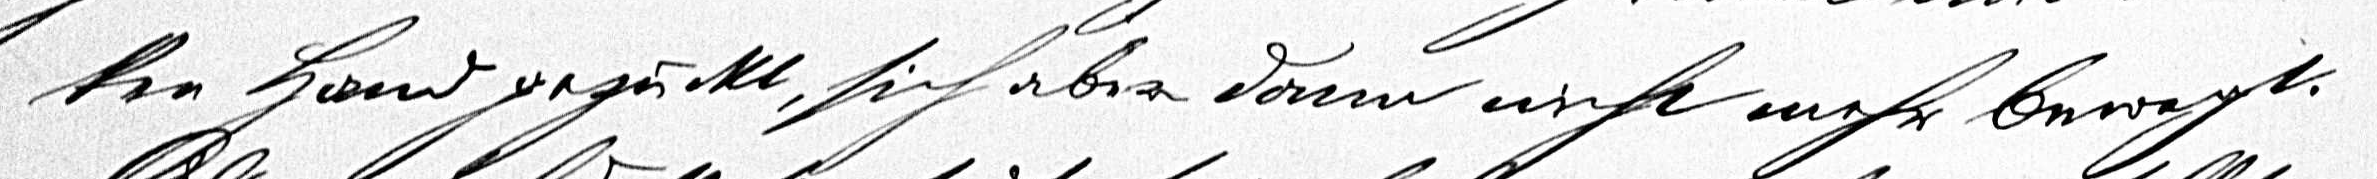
ken Hand gezückt, sich aber dann nicht mehr bewegt.
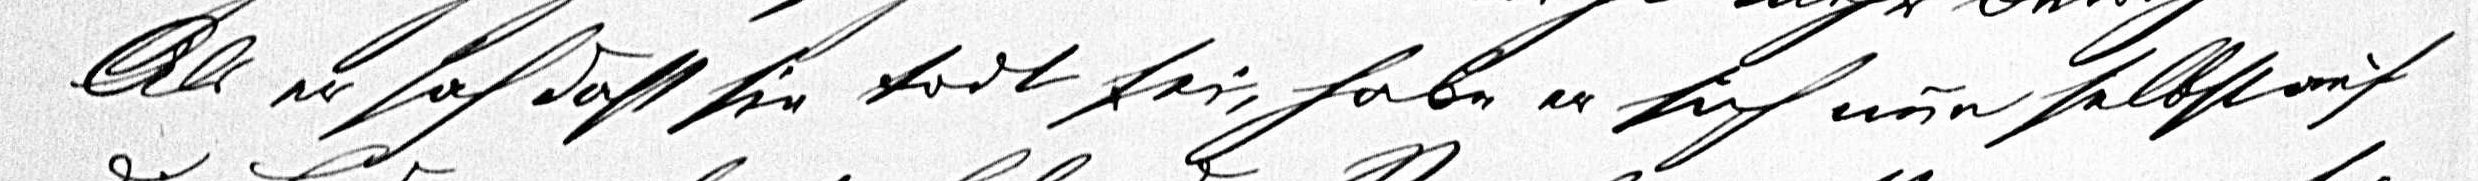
Als er sah daß sie todt sei, habe er sich nun selbst auf
